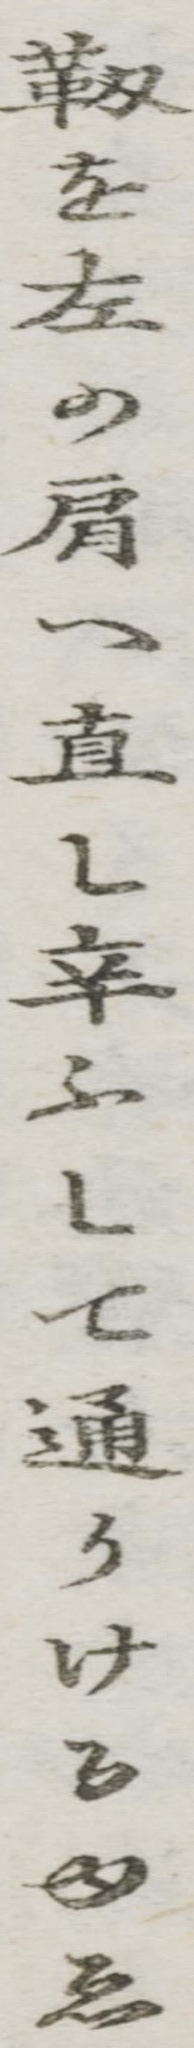靭を左の肩へ直し辛ふして通りけるゆゑ
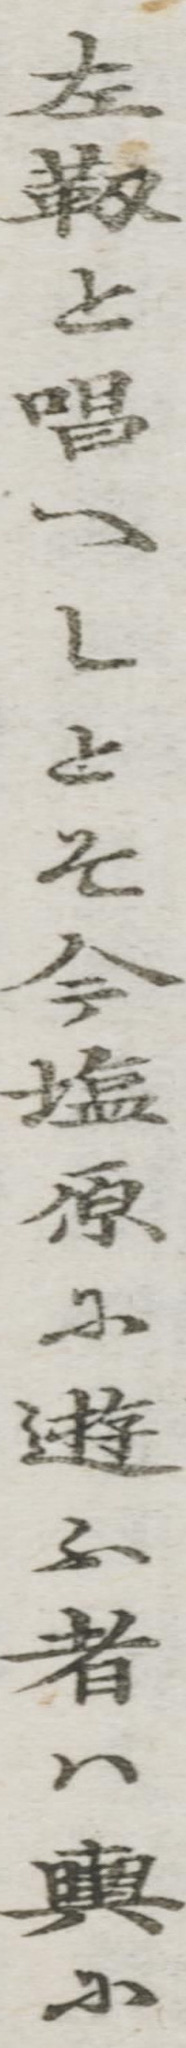左靭と唱へしとそ今塩原に遊ふ者は輿に
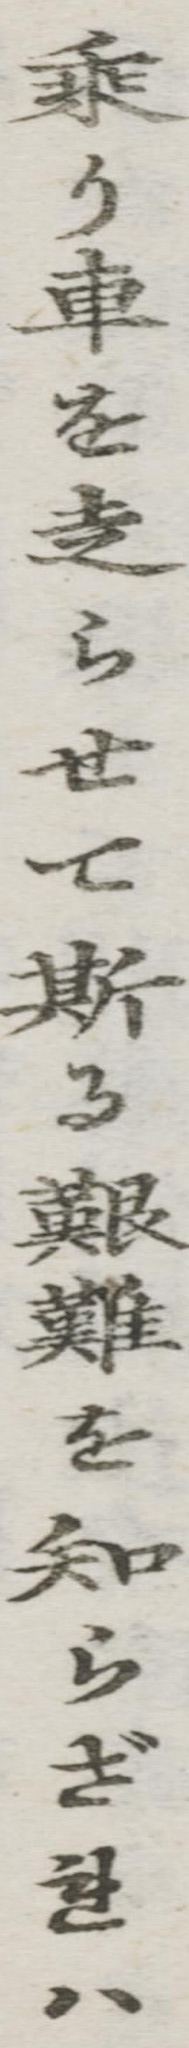乗り車を走らせて斯る艱難を知らざれは
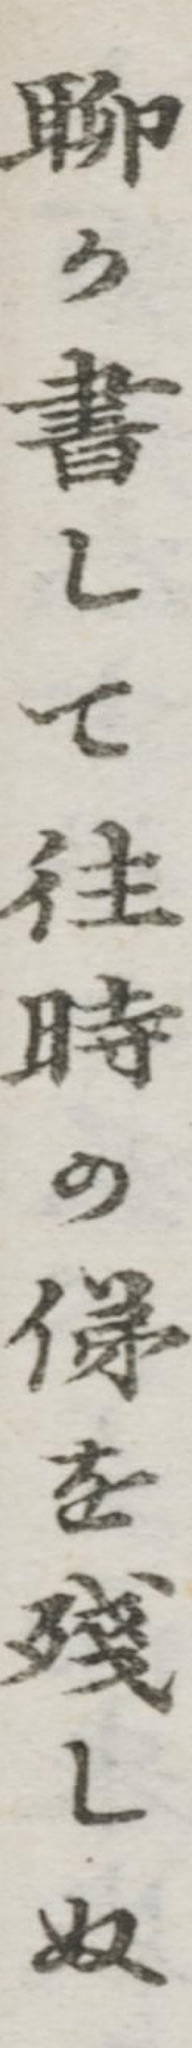聊か書して往時の俤を残しぬ
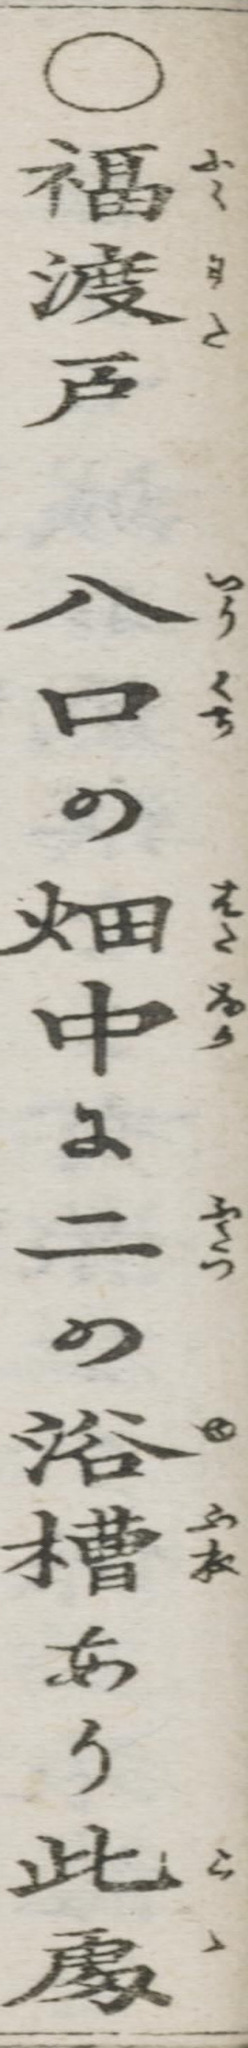○福渡戸入口の畑中に二の浴槽あり此処
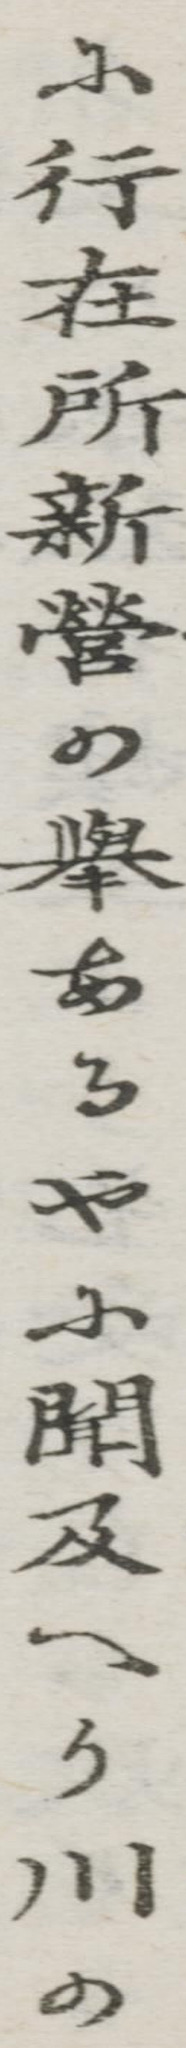に行在所新営の挙あるやに聞及へり川の
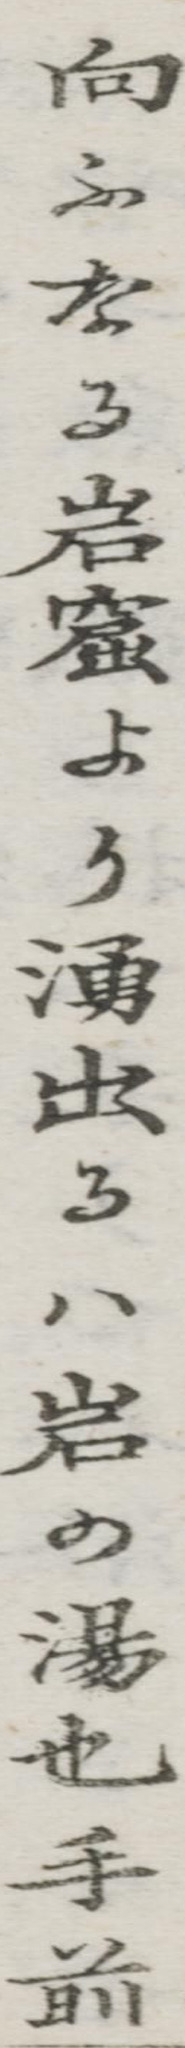向ふなる岩窟より湧出るは岩の湯也手前
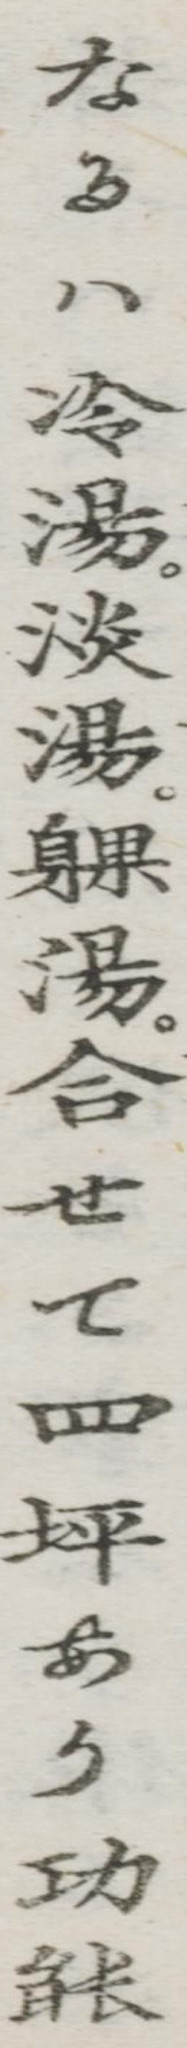なるは冷湯。淡湯。裸湯。合せて四坪あり功能
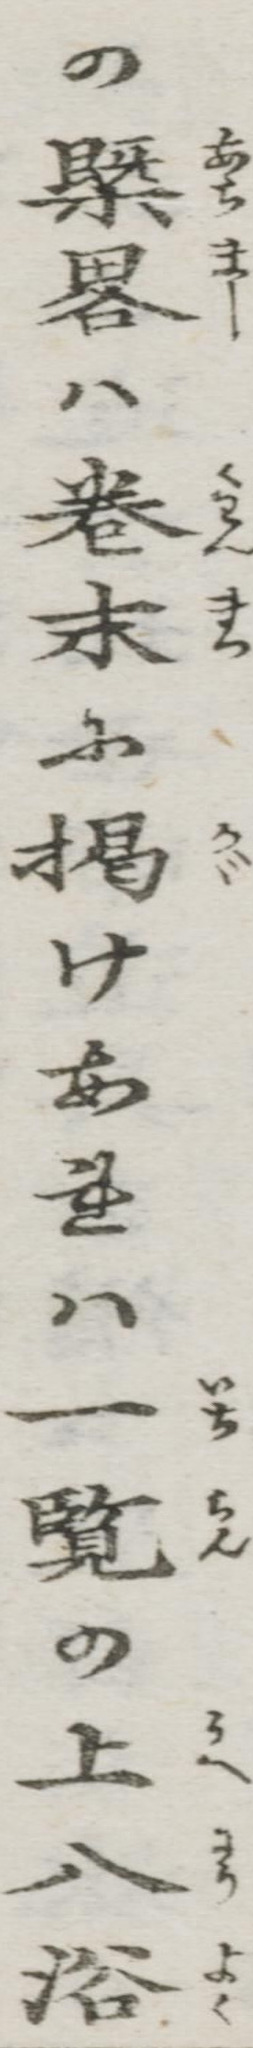の概略は巻末に掲けあれは一覧の上入浴
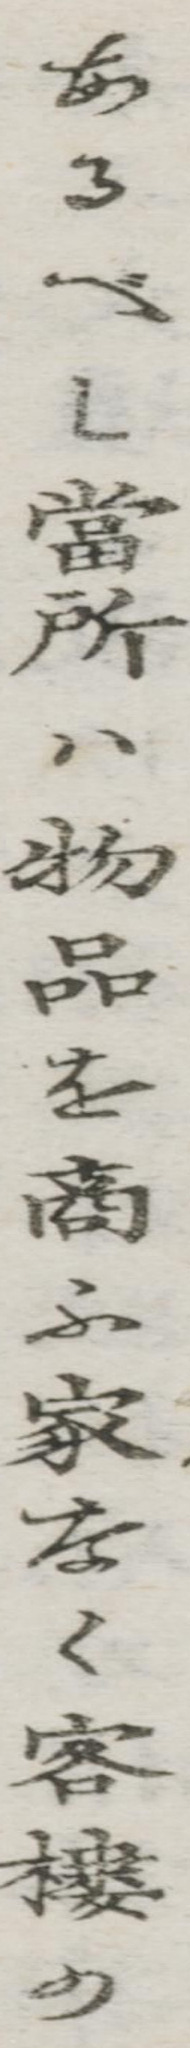あるべし当所は物品を商ふ家なく客楼の
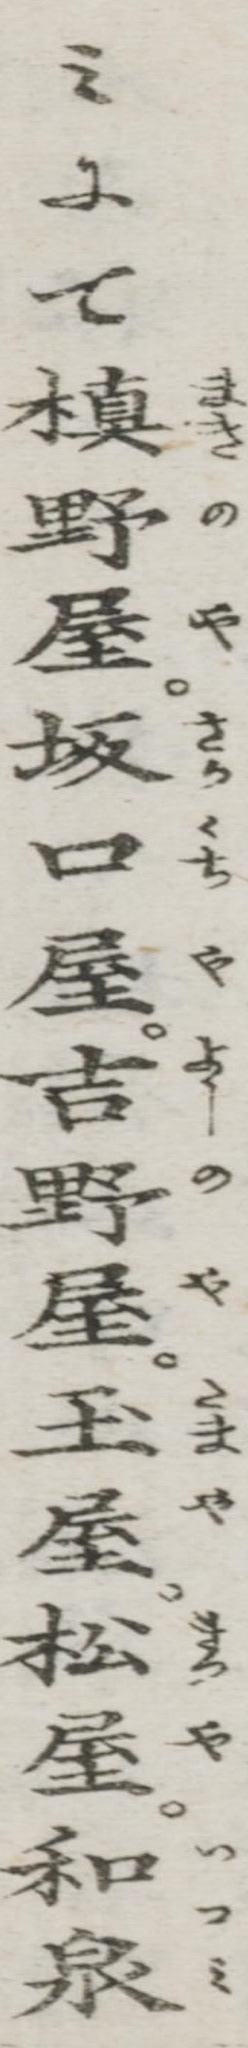みにて槙野屋。坂口屋。吉野屋。玉屋。松屋。和泉
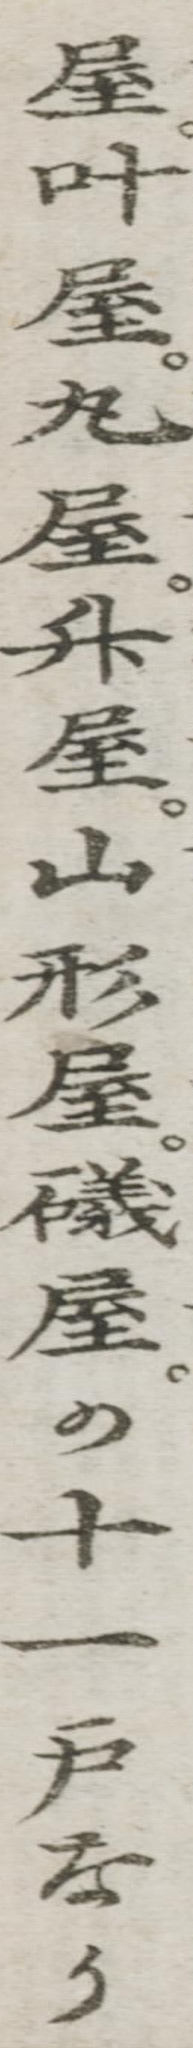屋。叶屋。丸屋。升屋。山形屋。磯屋。の十一戸なり

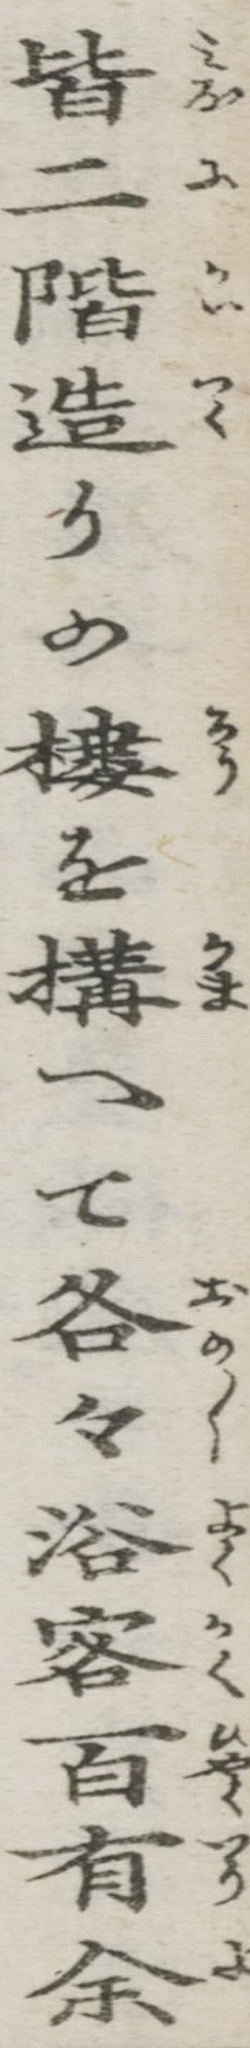皆二階造りの楼を構へて各々浴客百有余
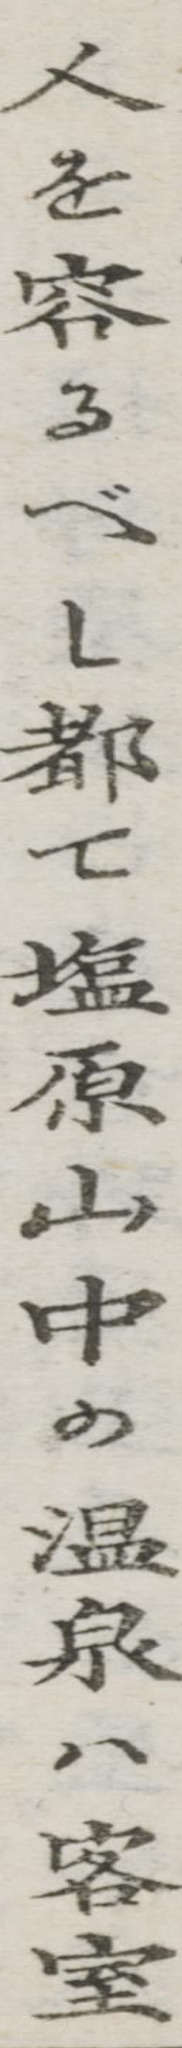人を容るべし都て塩原山中の温泉は客室
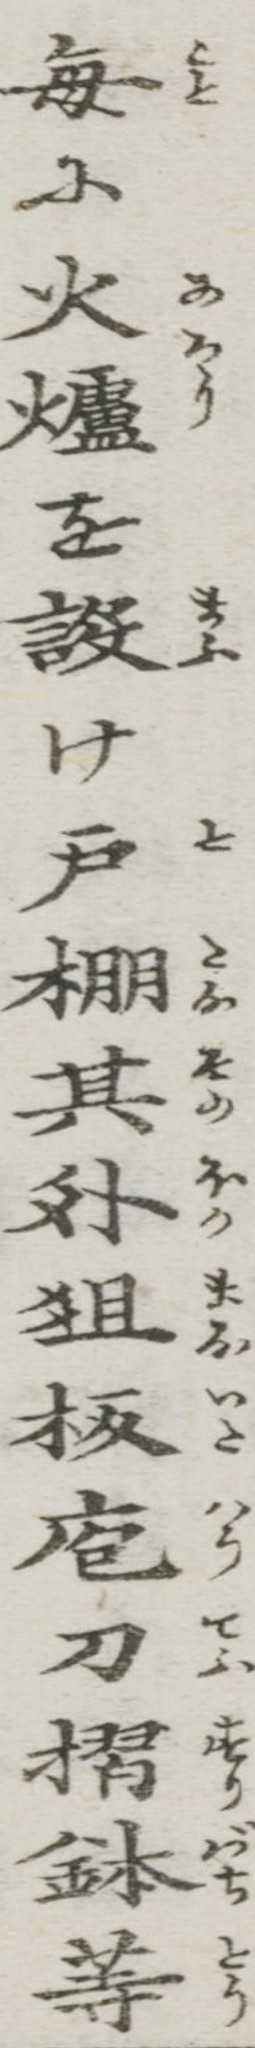毎に火爐を設け戸棚其外俎板包丁摺鉢等
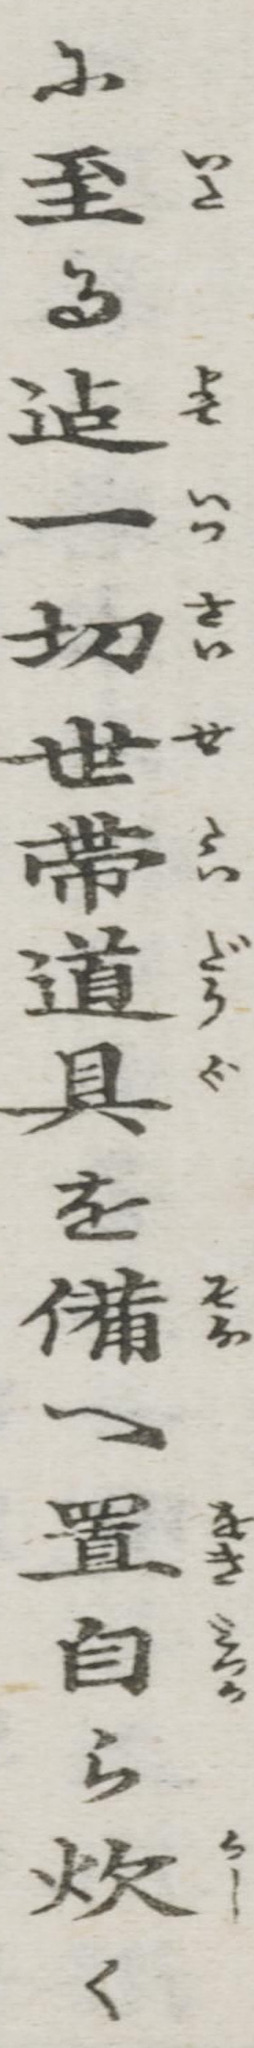に至る迄一切世帯道具を備へ置自ら炊く
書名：塩原繁昌記　全
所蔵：東京大学地震研究所図書室 Earthquake Research Institute Library, The University of Tokyo, JAPAN
